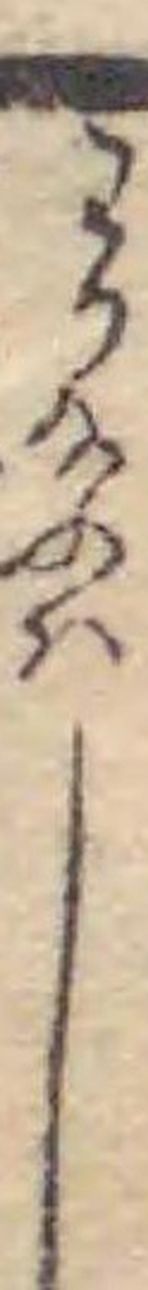わり給ふは
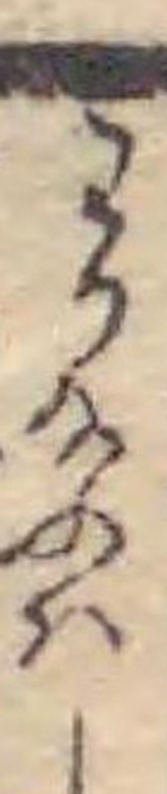わり給ふは
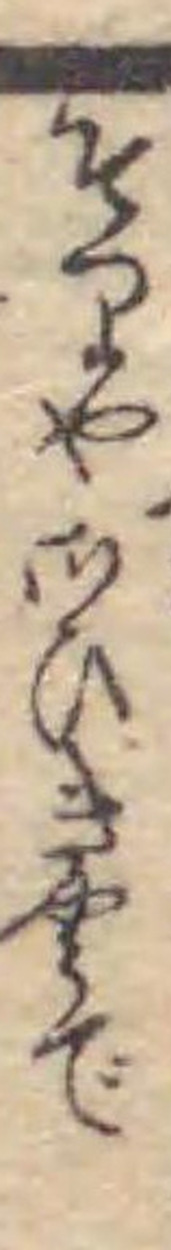そりや御ひきようで
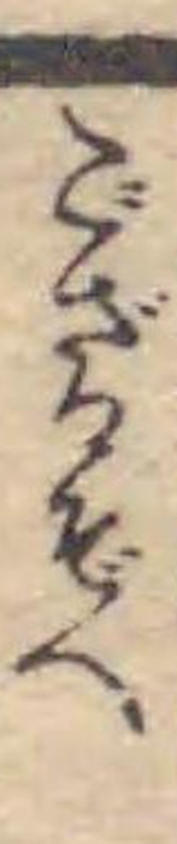ござるぞへ
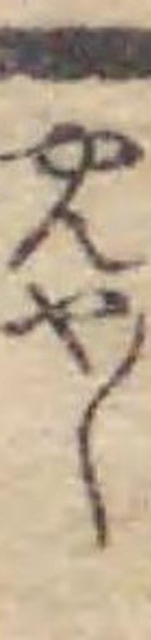やんや〳〵
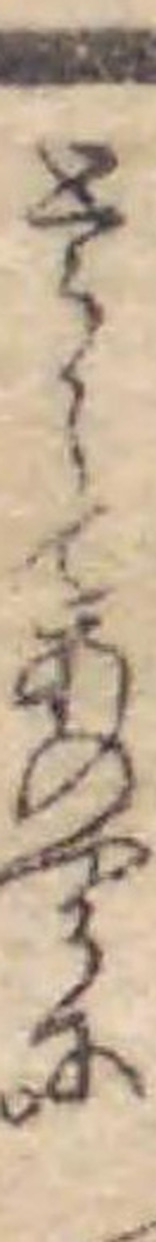とうしてあのやうに
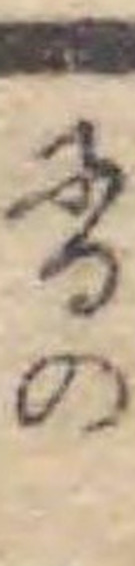にるの
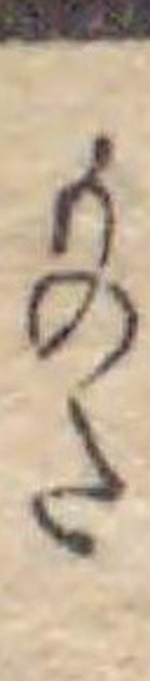ものた

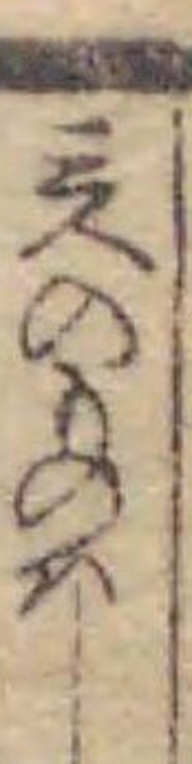三人のものは
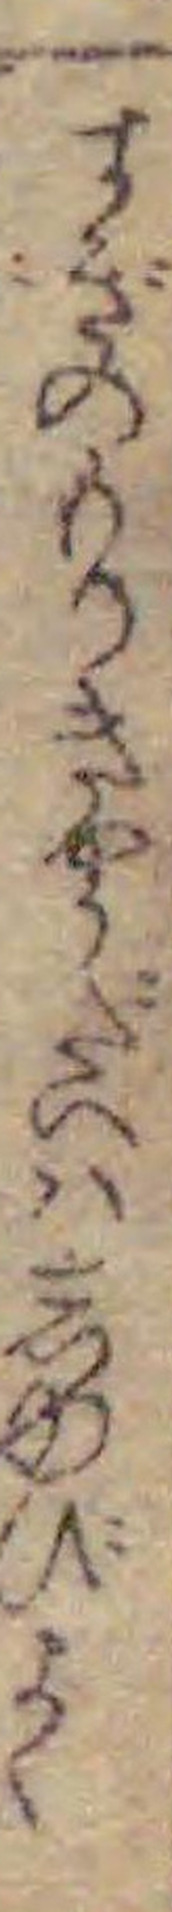すぎのもりきゃうだいはしゆびよく
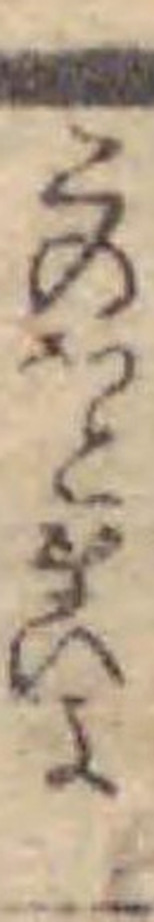このとまいよ
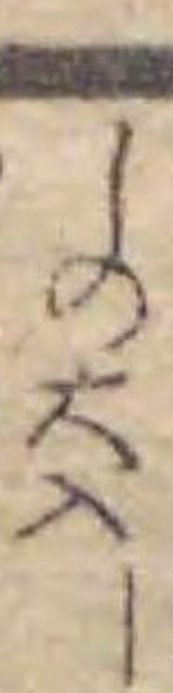しの大入
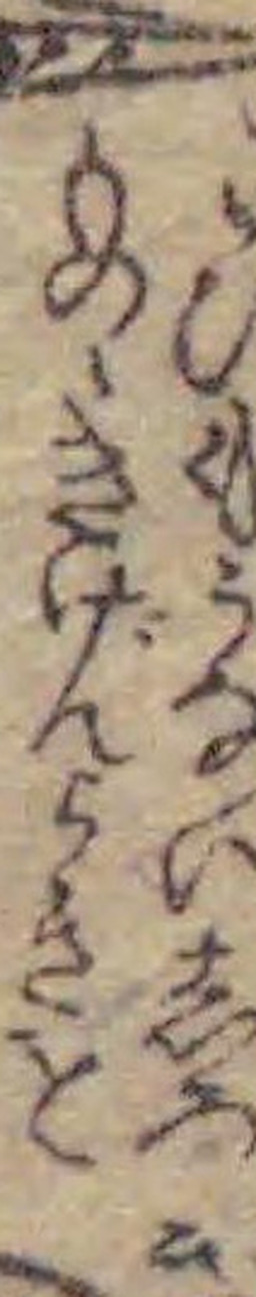ものゝきげんよきを
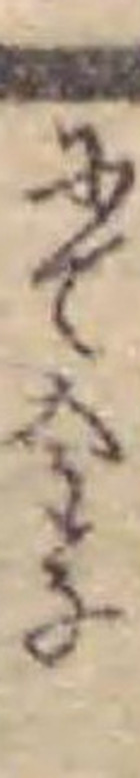にて金子
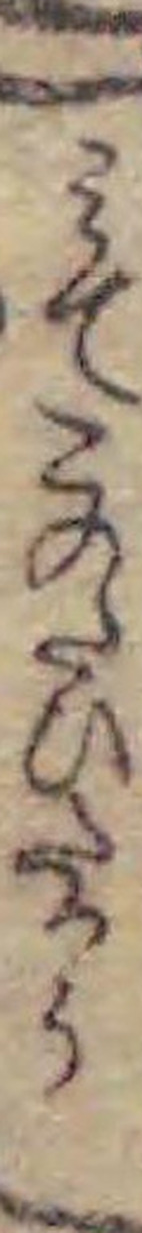みてこのたびたから
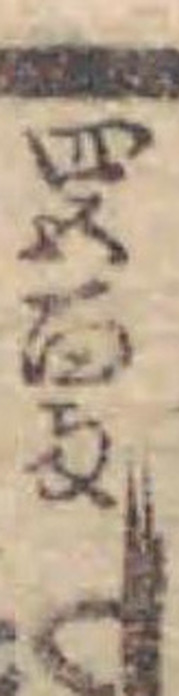四五百両
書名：扨化狐通人 : 2巻
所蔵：国立国会図書館 National Diet Library, JAPAN
